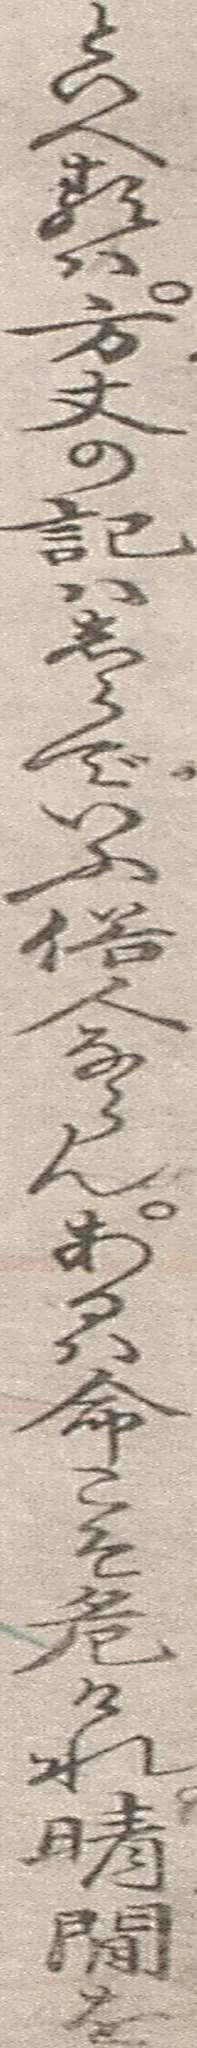といへるハ。方丈の記ハしらでいふ俗人ならん。あるハ命こそ危けれ。晴間を
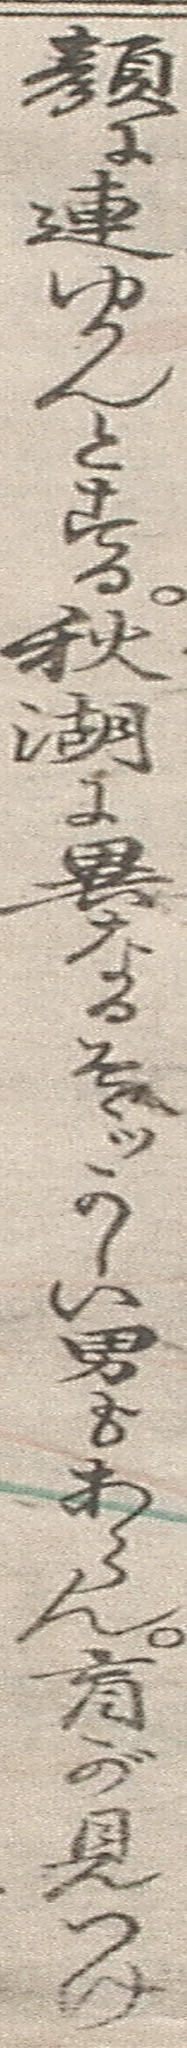顔に連ゆかんとする。秋湖に異なるそゝッかしい男もあらん。盲が見つけ
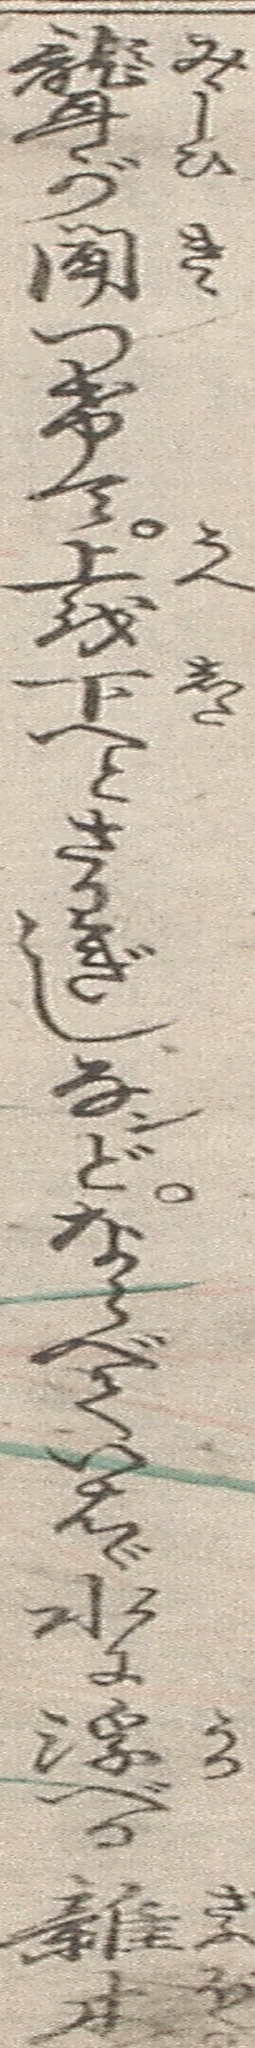聾が聞つけて。上を下へとさわぎしなンど。ならべていはゞ水に浮べる雑木
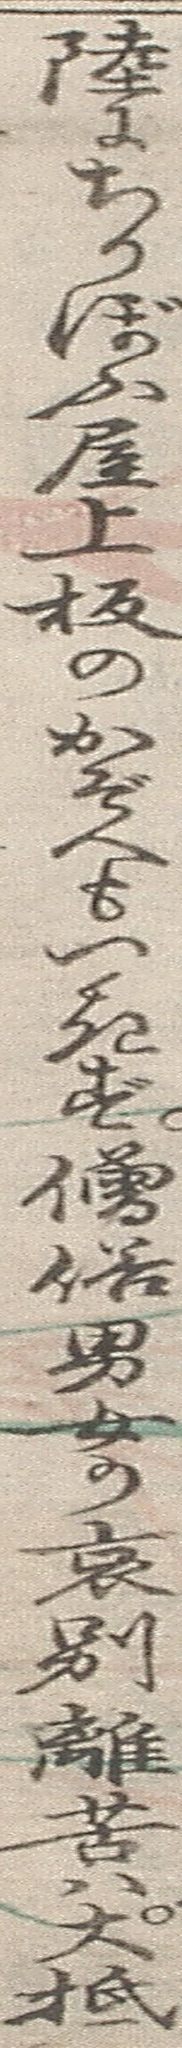陸にちりぼう家根板のかぞへもつきず。僧俗男女の哀別離苦ハ。大抵
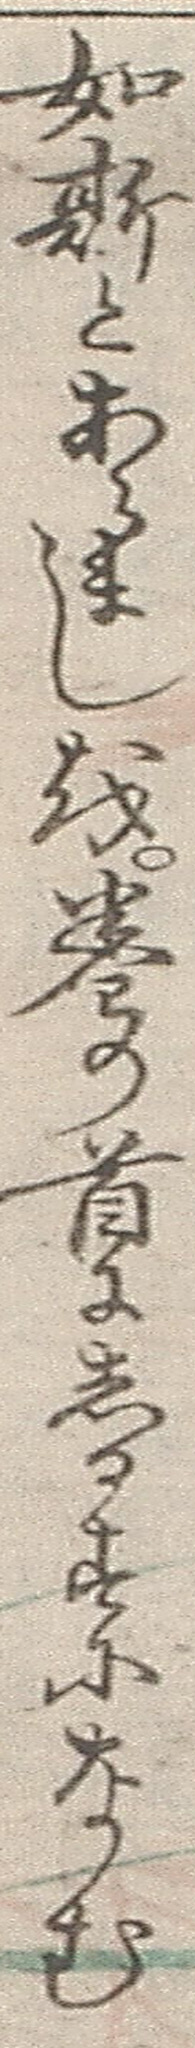如斯とあらましを。巻の首にしるすになむ
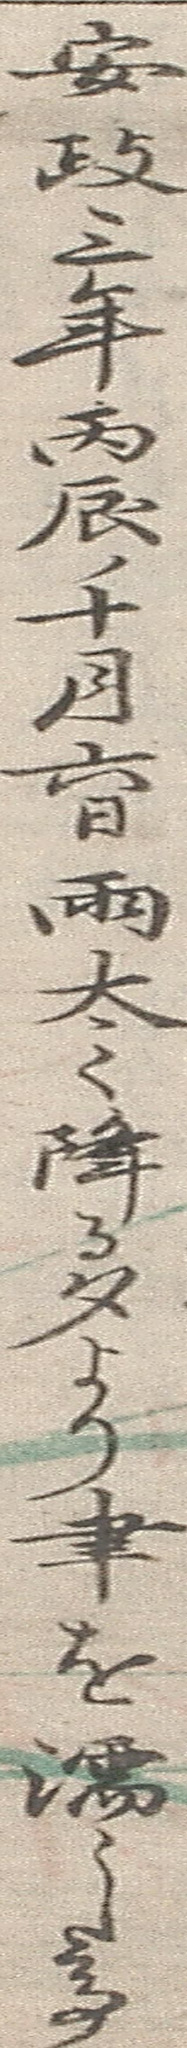安政三年丙辰ノ十月六日雨太く降る夕より聿を濡して
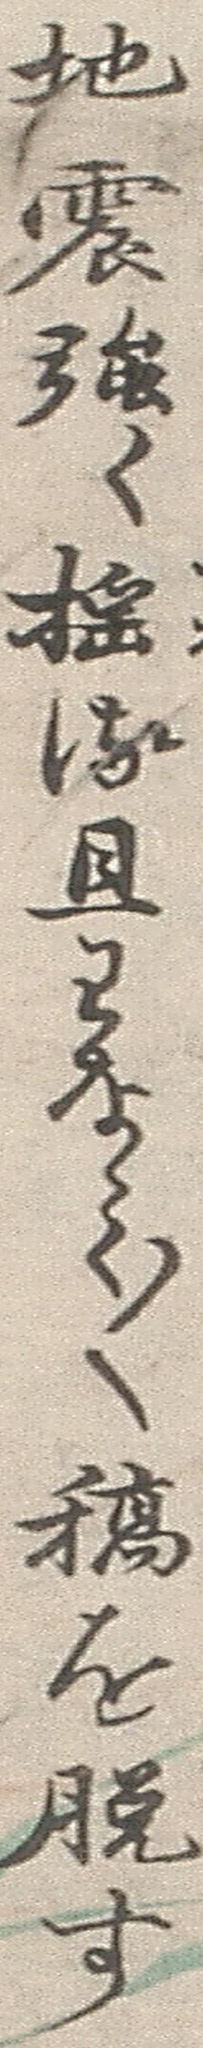地震強く揺る旦わな〳〵稿を脱す
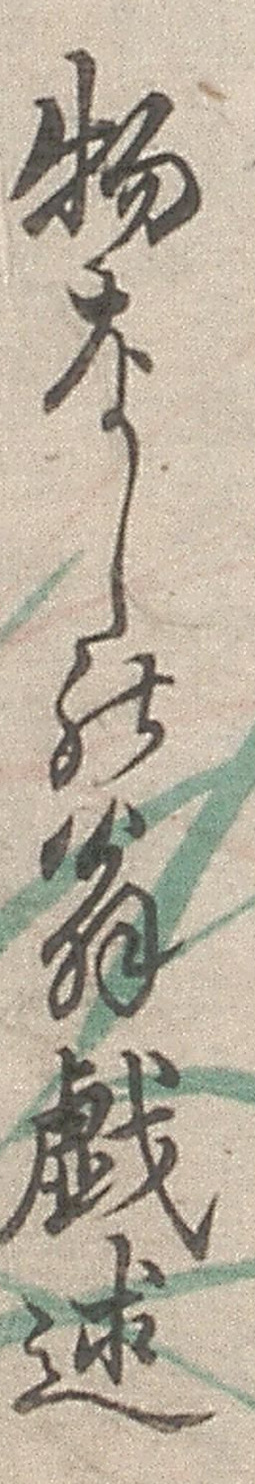物なしの翁戯述

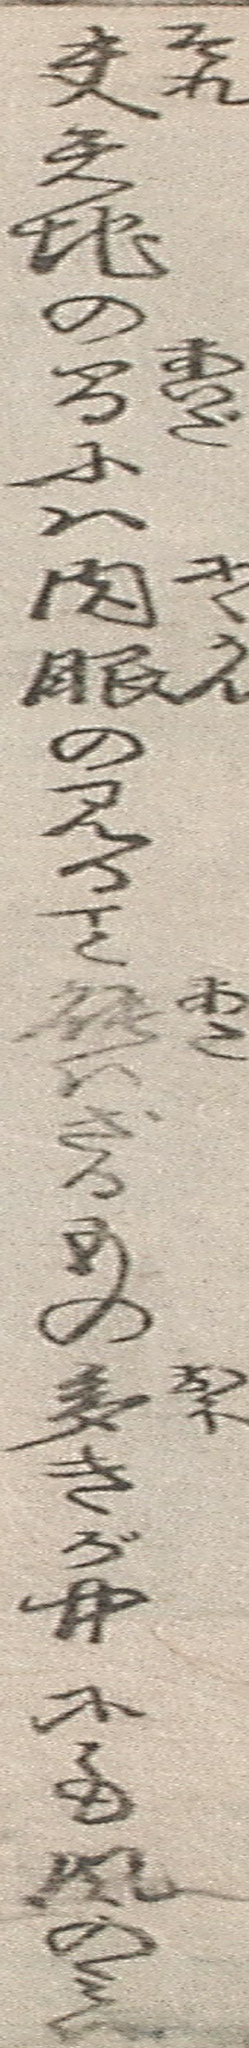夫天地の間にハ肉眼の見ること能ハさるもの多きが中にも風のミハ
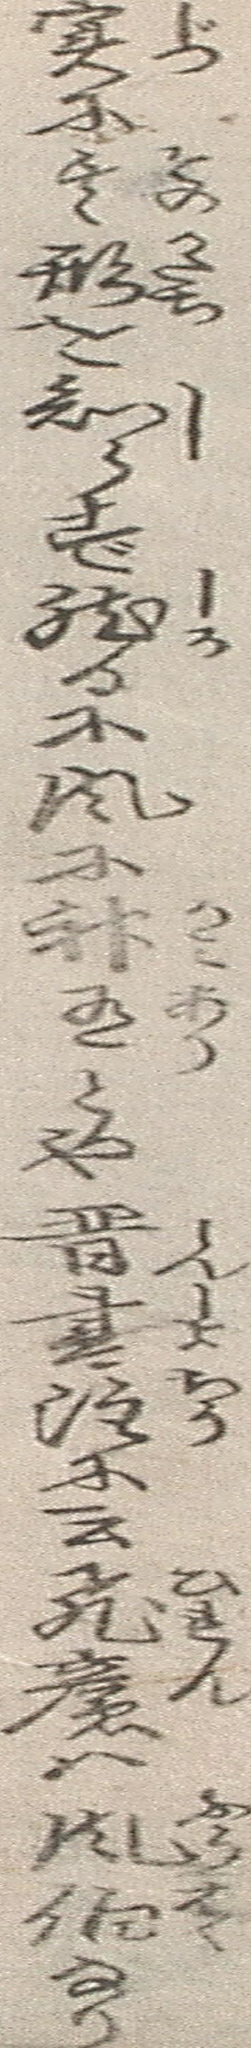実に其形を知らず然るに風に神有とや晋書註に云飛廉ハ風伯なり
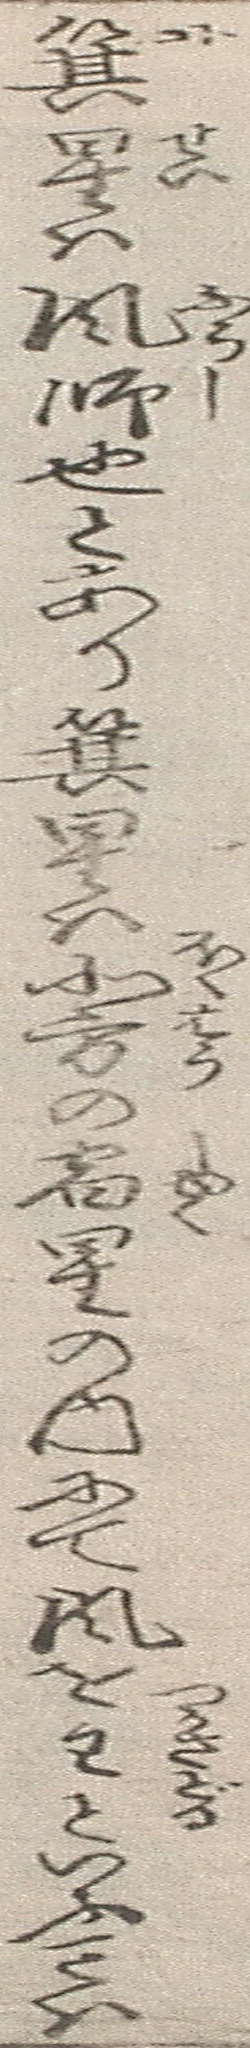箕星ハ風師也とあり箕星ハ北方の宿星の内にて風を主といふことハ
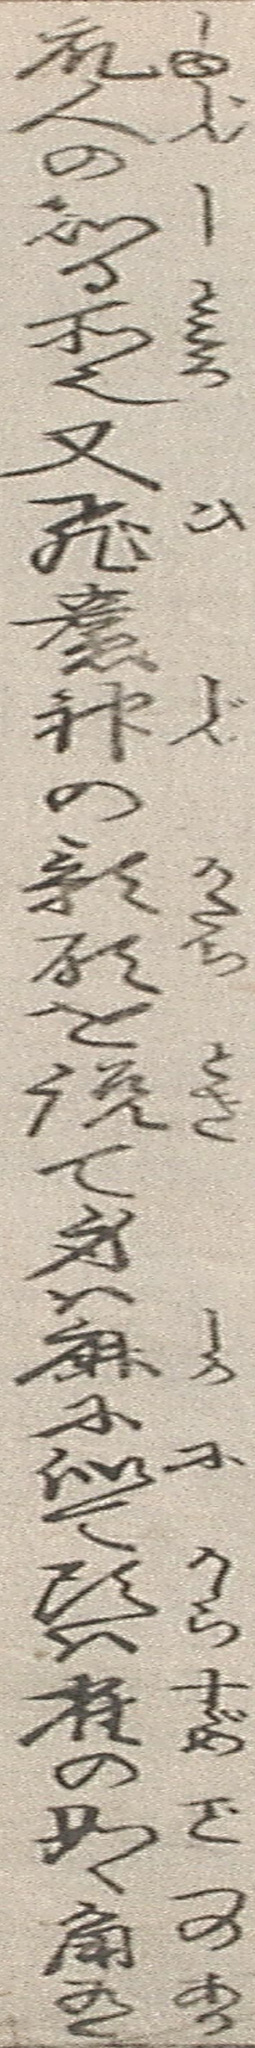衆人の知る所也又飛廉神の新顔を説て身ハ鹿に似て頭ハ雀の如く角有
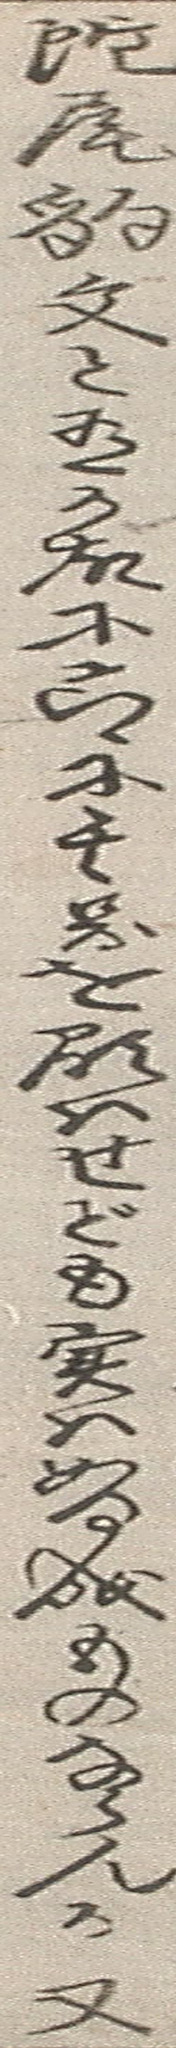蛇尾豹文と有か故にこゝに其図を顕ハせども実ハ如何成ものならんか又
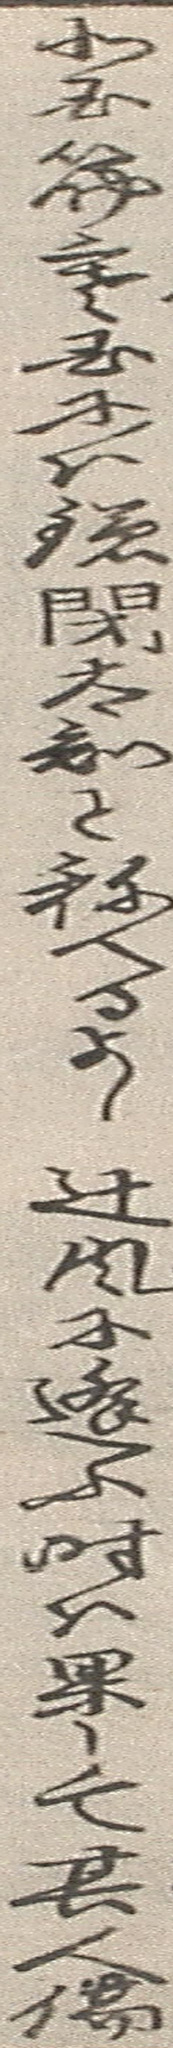北国筋寒国にハ鎖閉大和と称へるよし辻風に逢ふ時ハ果して其人傷
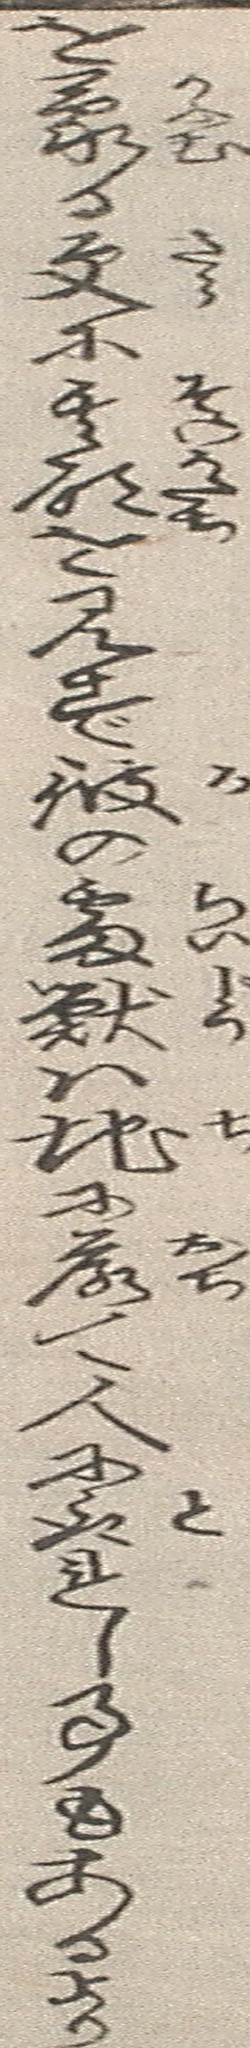を蒙る更に其顔を見ず彼の雷獣は地に落て人に取れし事もあるより
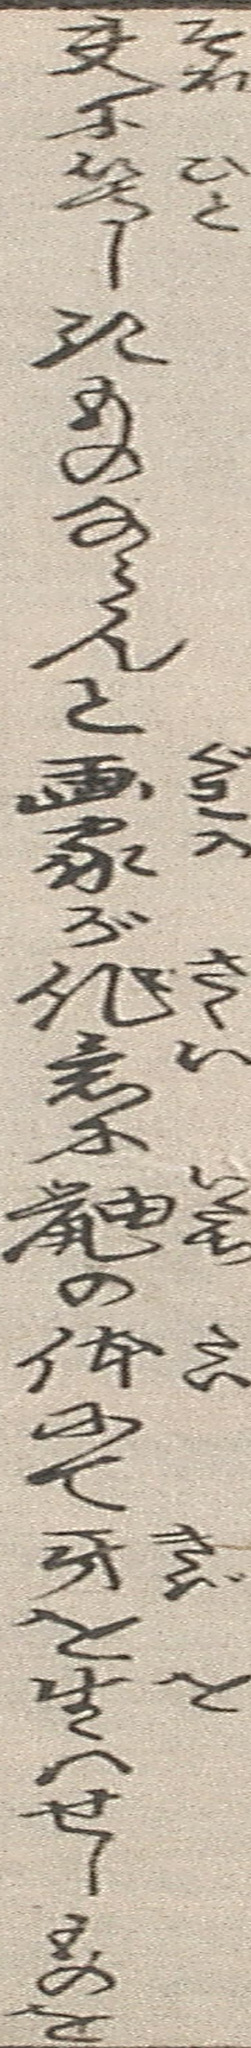夫に等しきものならんと画家が作意に鼬の体にて牙を生ハせしものを
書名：安政風聞集　上中下　全
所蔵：東京大学地震研究所図書室 Earthquake Research Institute Library, The University of Tokyo, JAPAN
